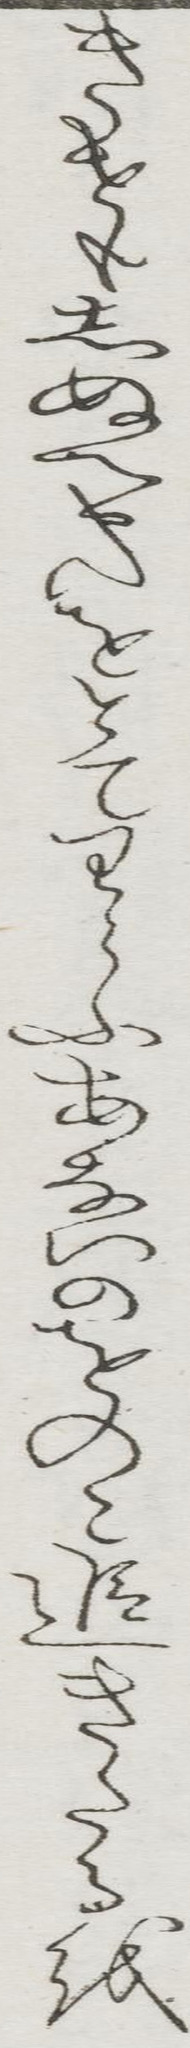きせもしぬへきをとてわらふあないのをこ追きたるを
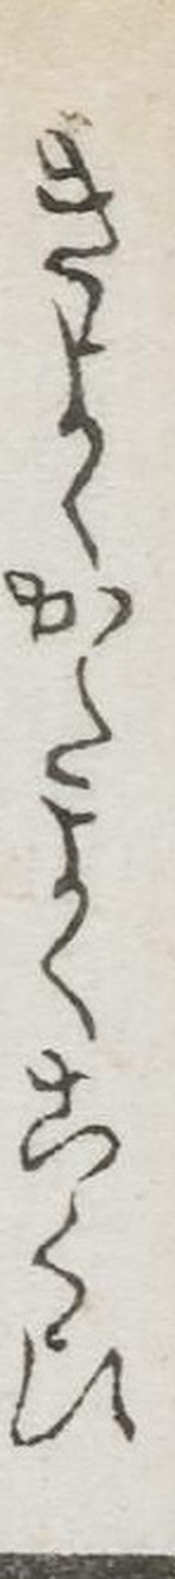きよくかたよくこくひ
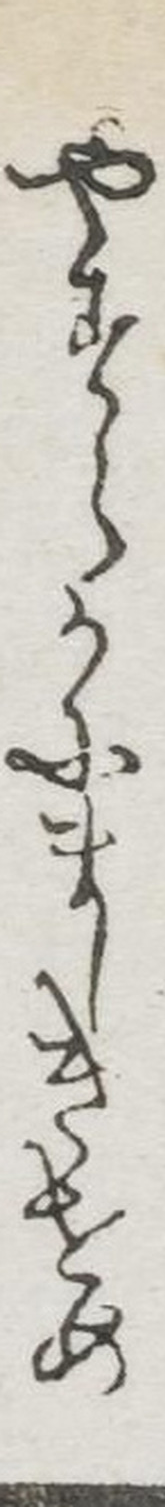やすらかにましきせめ

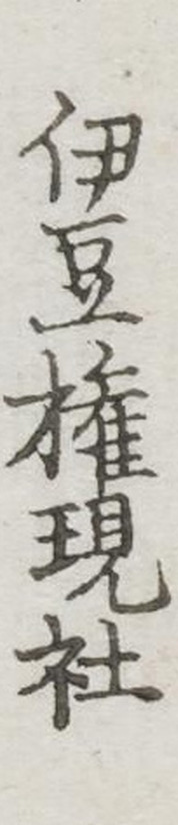伊豆権現社
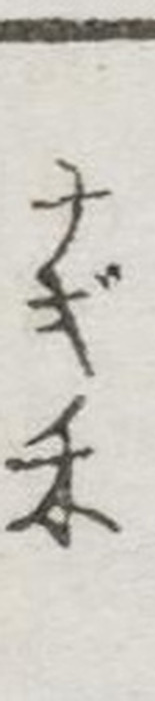ナギノ木
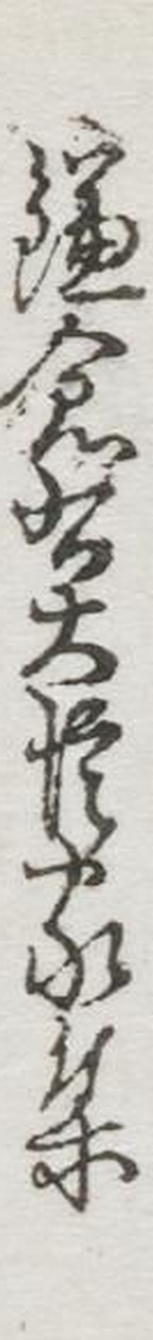鎌倉右大臣家集
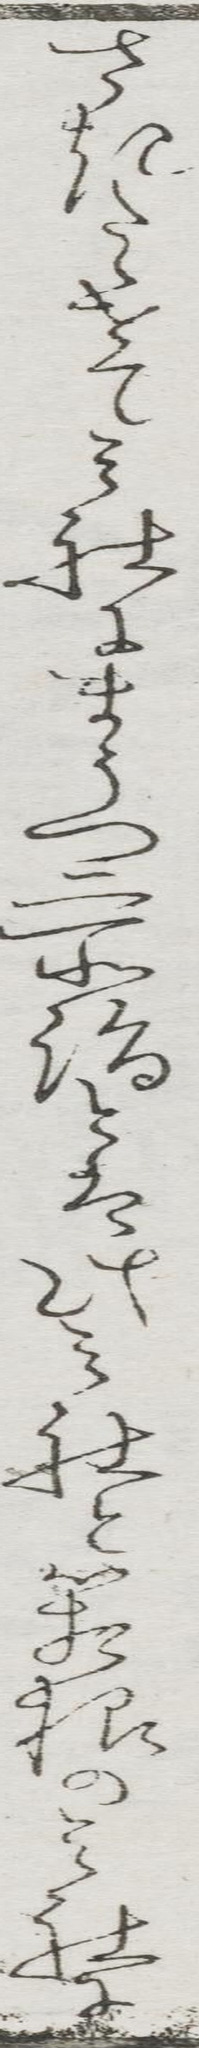さきたゝせてみ社にまうつ二所詣とは此み社と箱根のみ社に
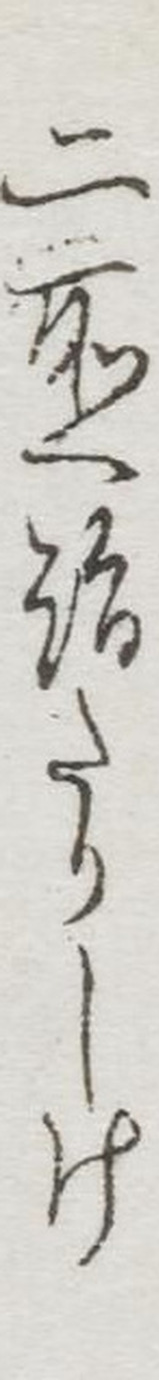二所へ詣たりしけ
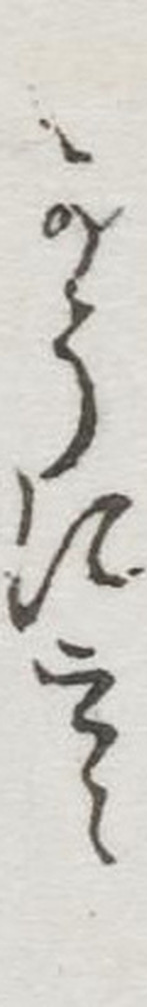かうに云々
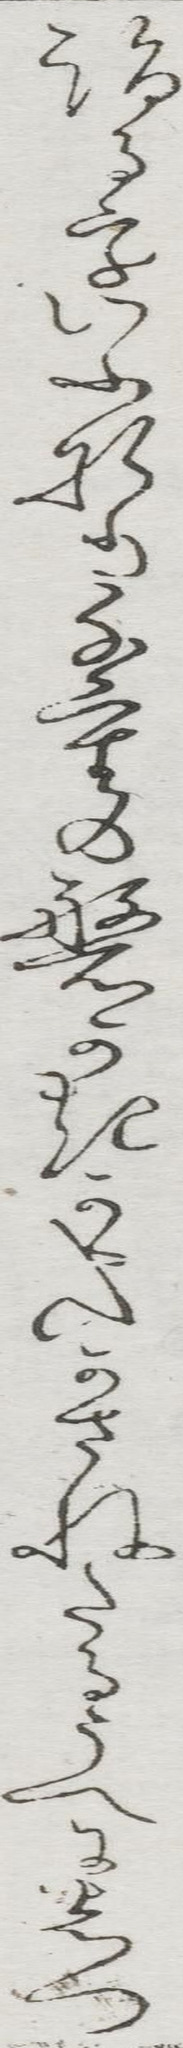詣るをいふなり千重の磐かきかきかさねたるうへにしつ
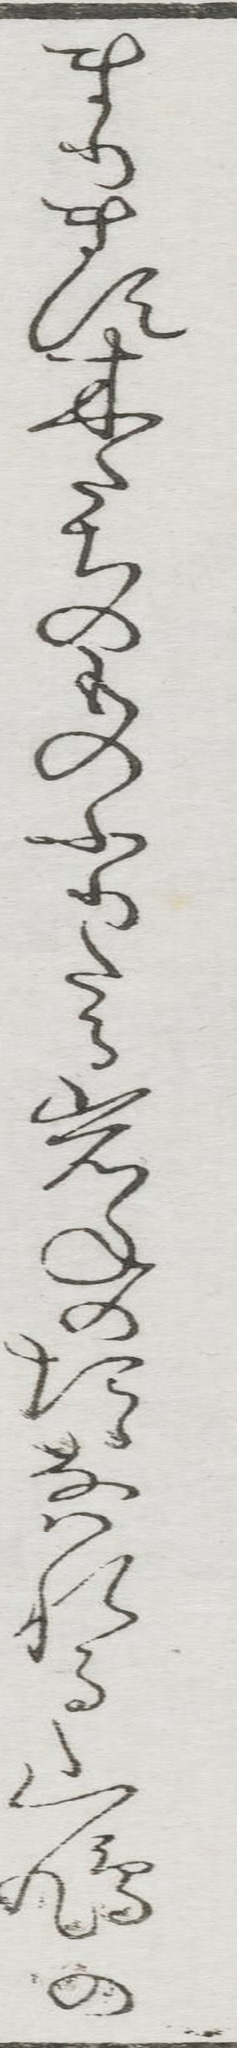まります木たちのものふりたる岩ねのたゝなはれる山鳩の
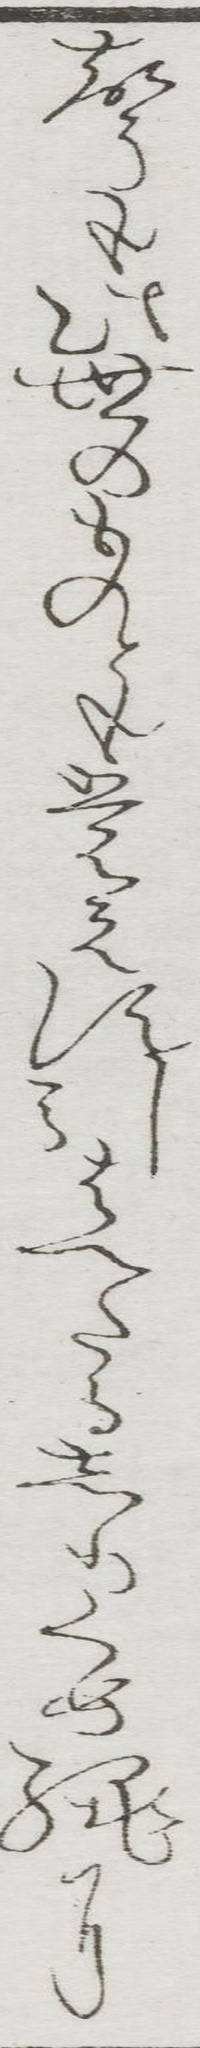声も此世のものとも覚えす引はへたるしりくめ縄に
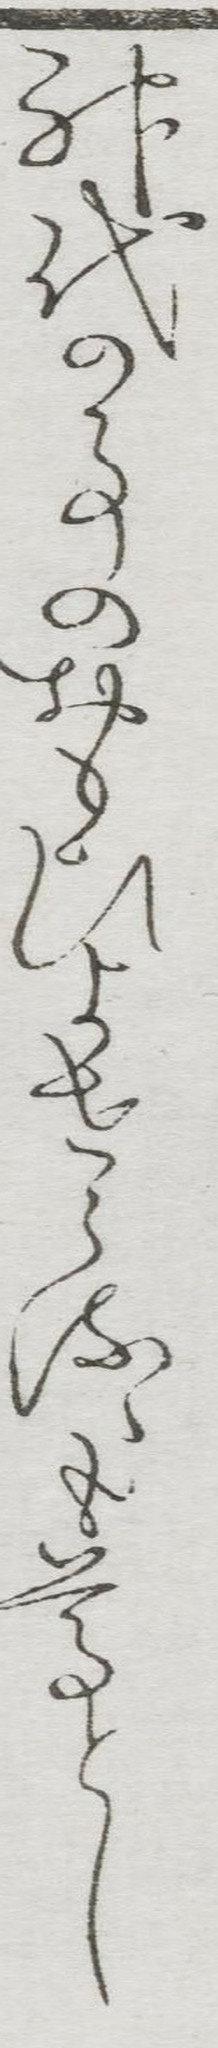神代の事のおもひよせらるゝも尊とし
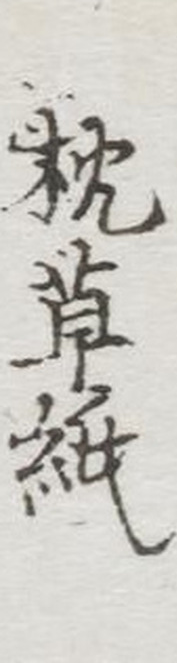枕草紙
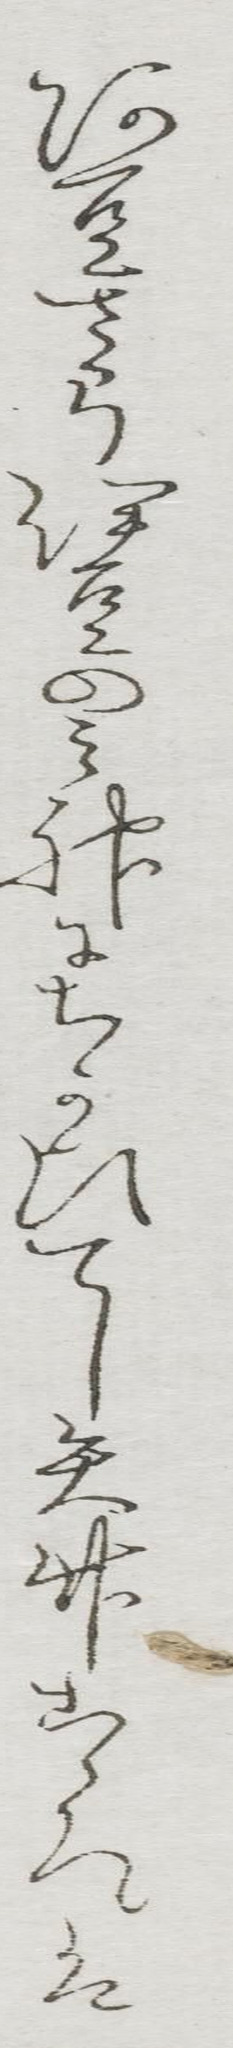あつさ弓伊豆のみ神にちかひてし矢竹こゝろは
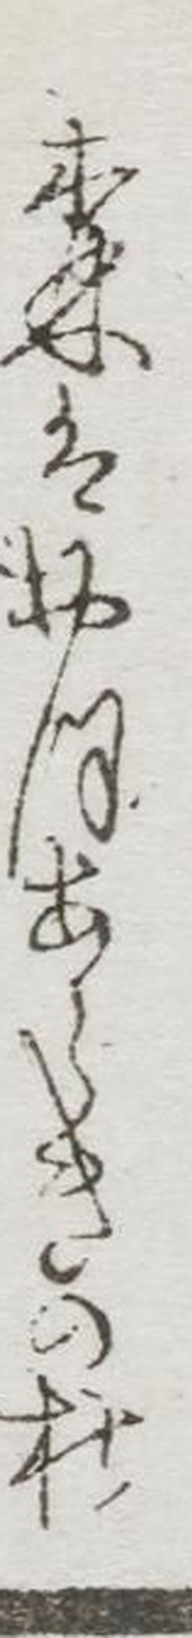森はおほあらきの杜
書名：挿画熱海日記　全
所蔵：東京大学地震研究所図書室 Earthquake Research Institute Library, The University of Tokyo, JAPAN
